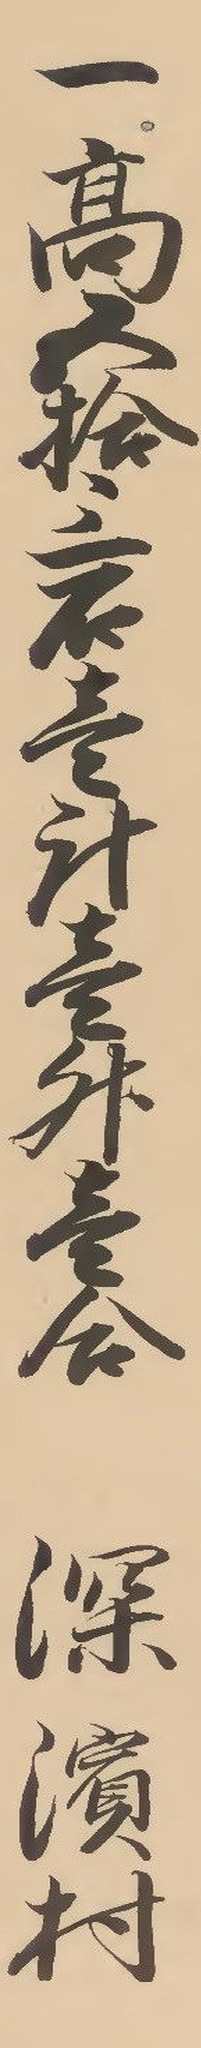一高五拾三石壱斗壱升壱合深浜村

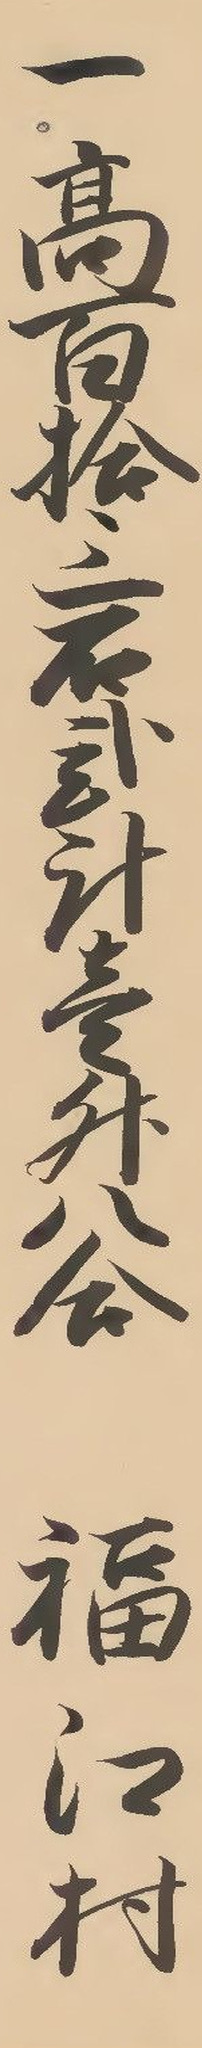一高百拾三石弐斗壱升八合福江村
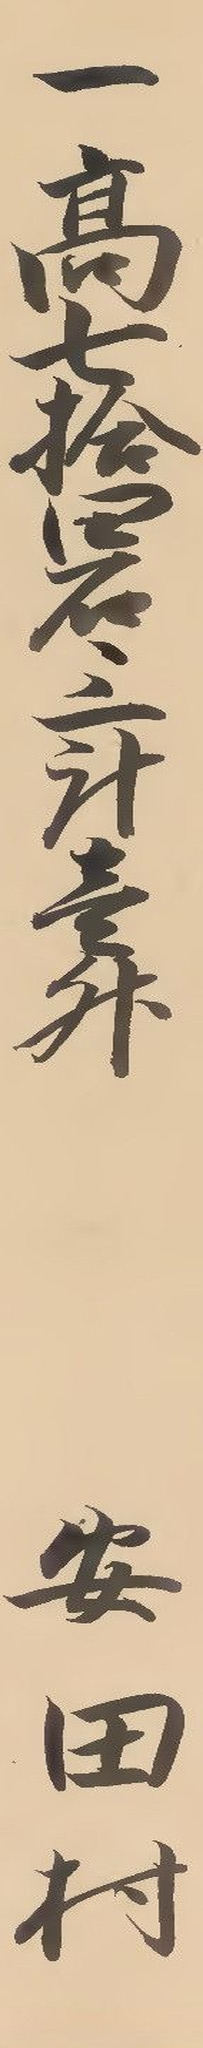一高七拾四石三斗壱升安田村
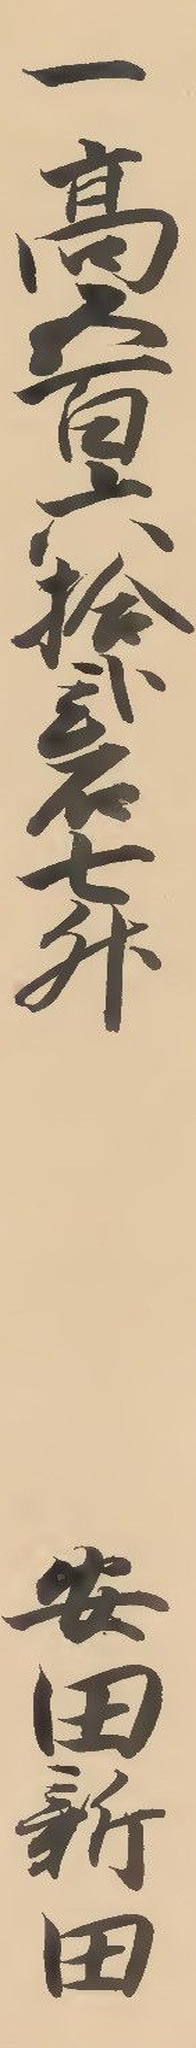一高五百六拾弐石七升安田新田
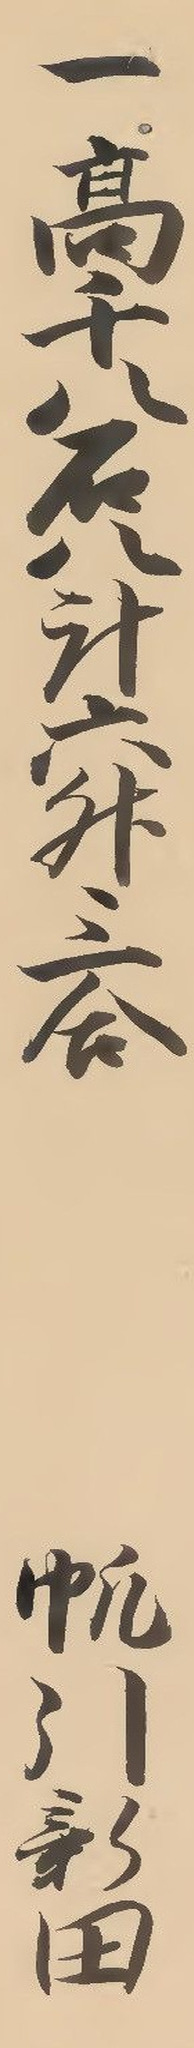一高千八石八斗六升三合帆引新田

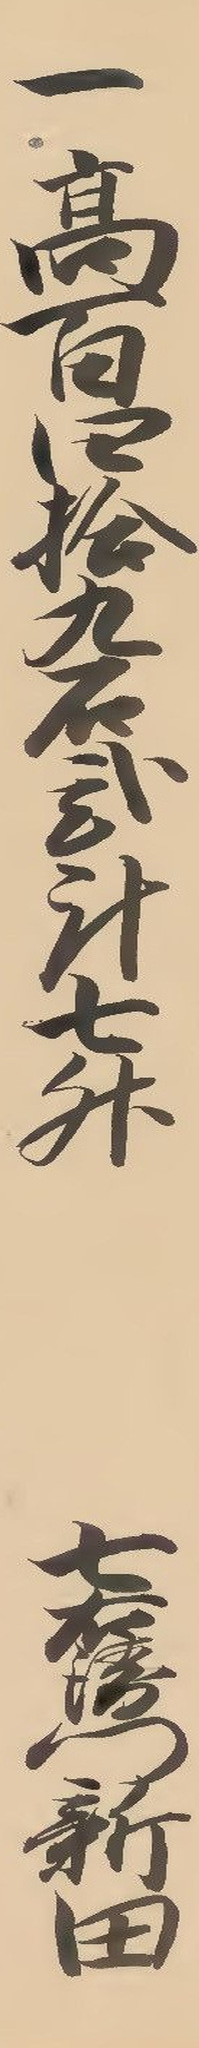一高百四拾九石弐斗七升七右衛門新田
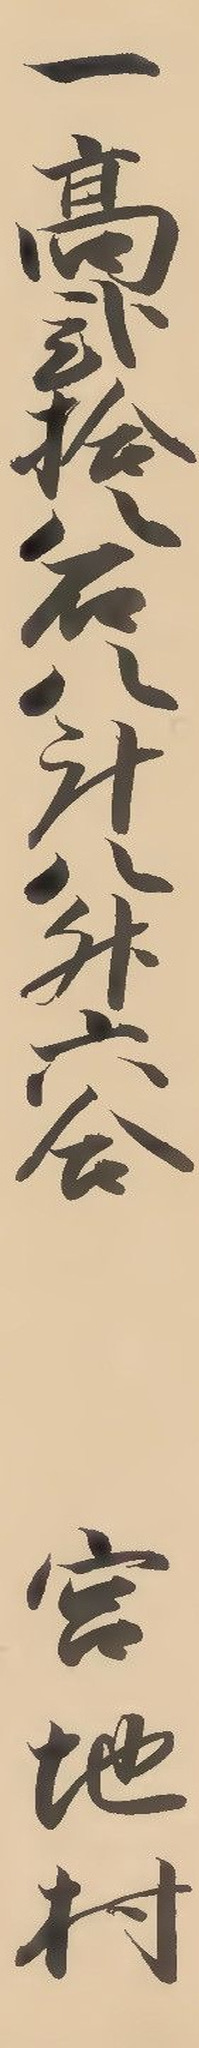一高弐拾八石八斗八升六合宮地村
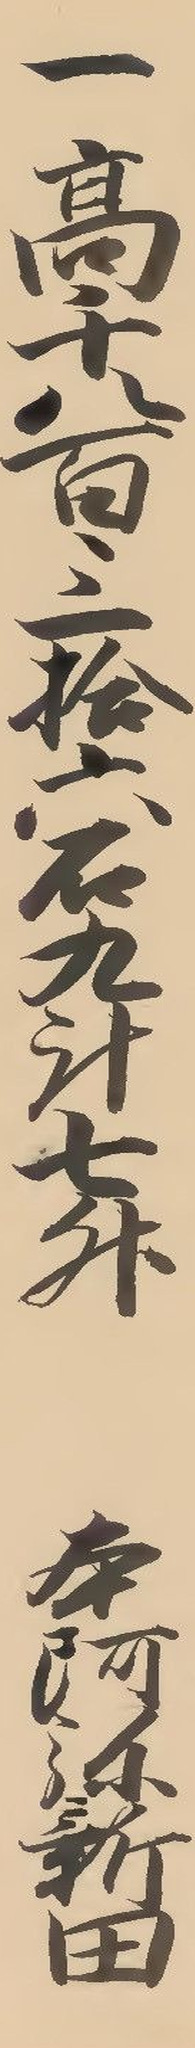一高千八百三拾六石九斗七升本阿弥新田
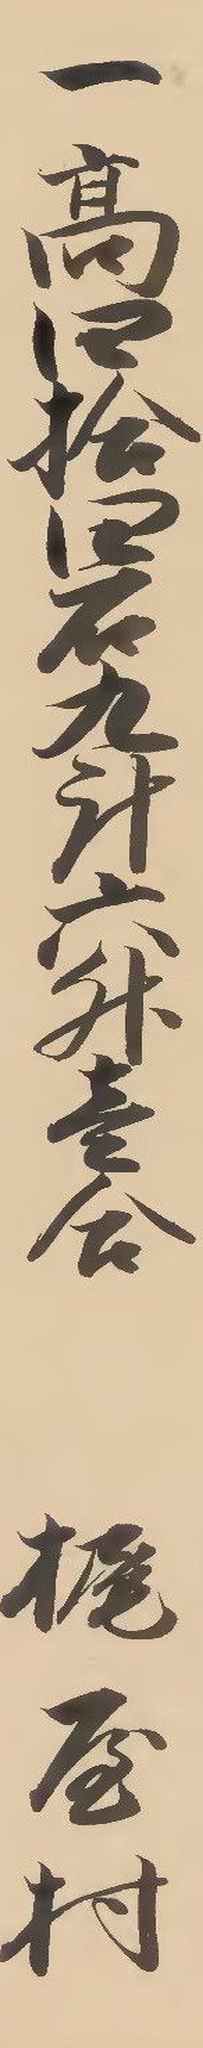一高四拾四石九斗六升壱合梶屋村
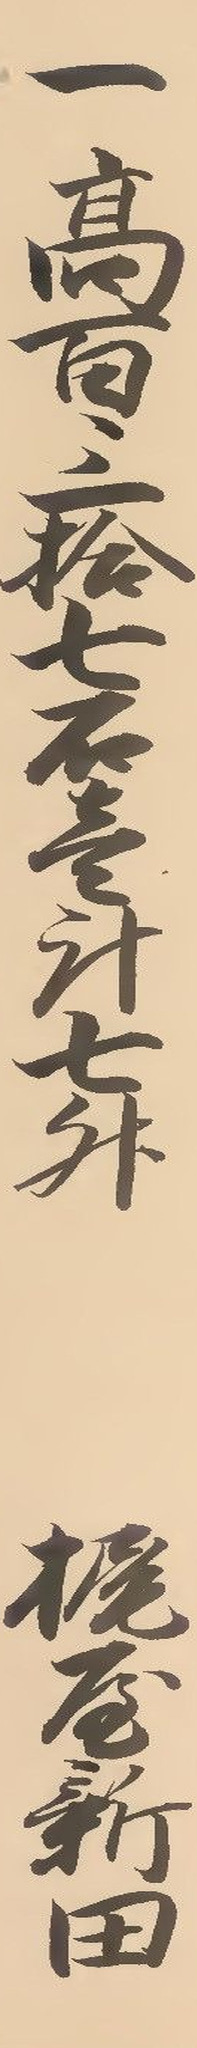一高百三拾七石壱斗七升梶屋新田
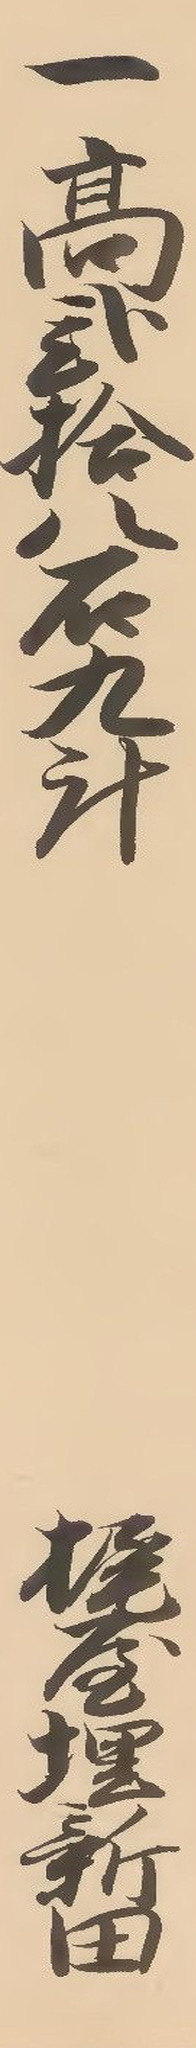一高弐拾八石九斗梶屋埋新田
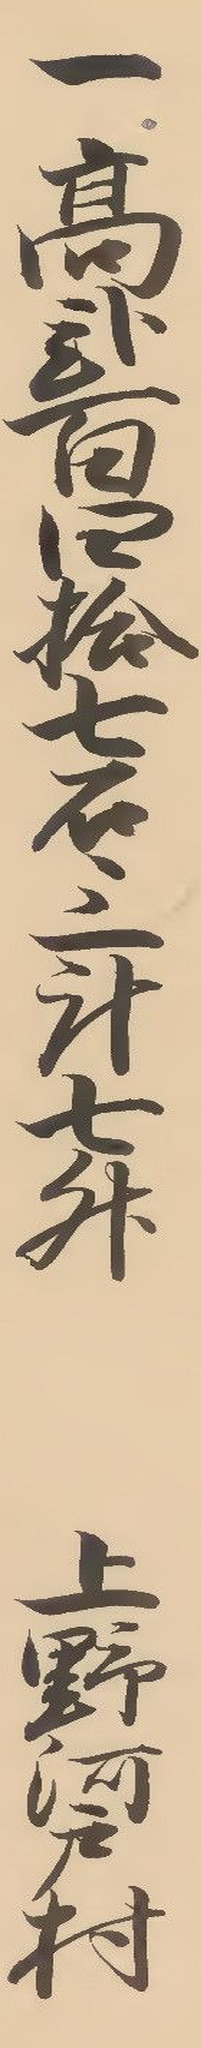一高弐百四拾七石三斗七升上野河戸村

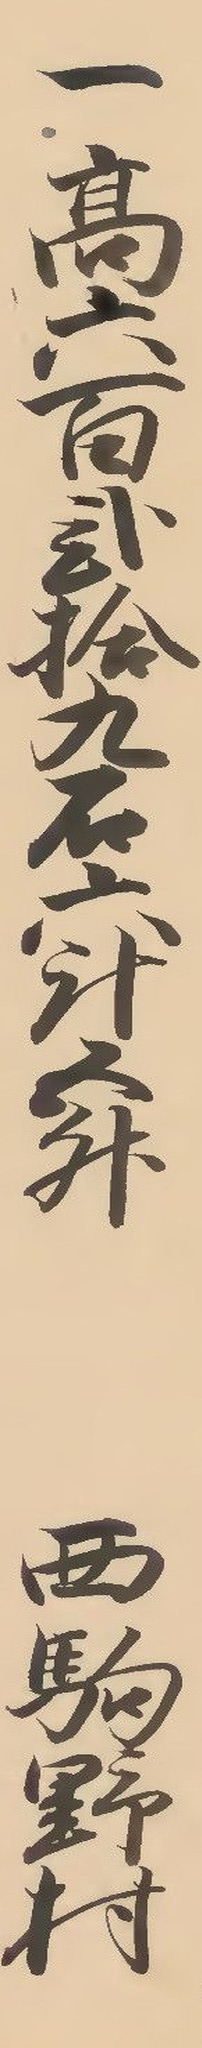一高六百弐拾九石六斗五升西駒野村
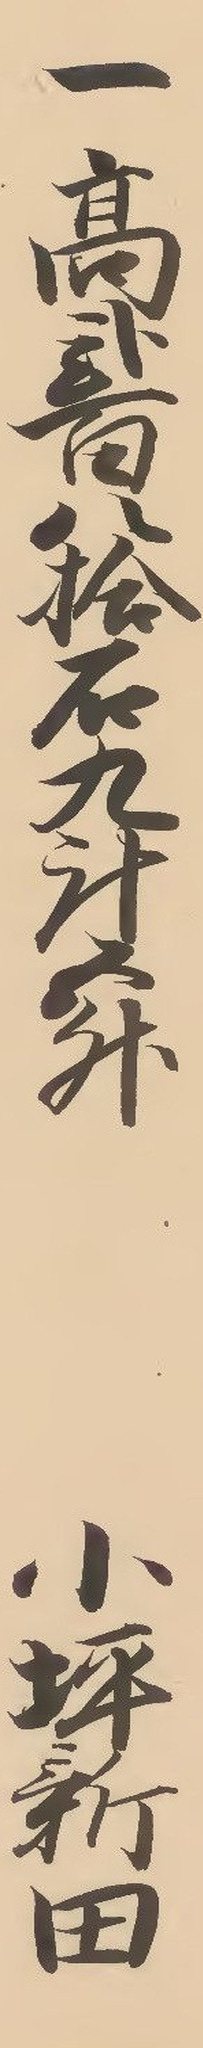一高弐百八拾石九斗五升小坪新田
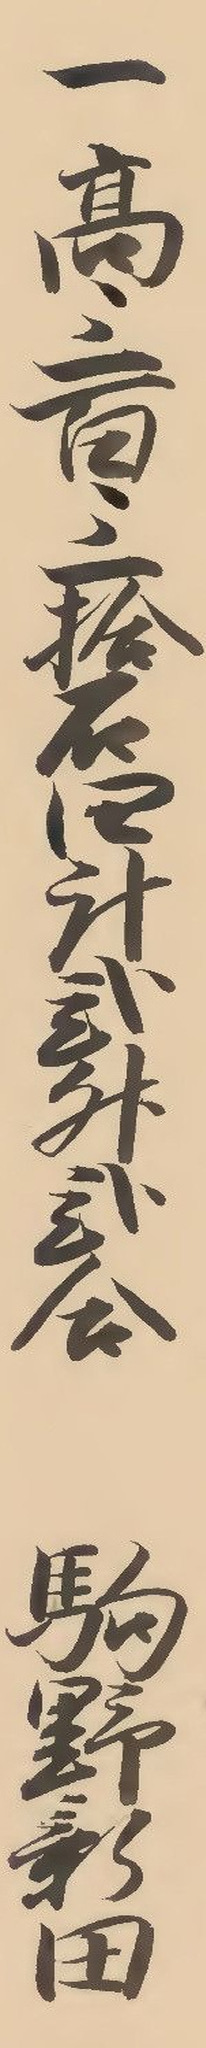一高三百三拾石四斗弐升弐合駒野新田
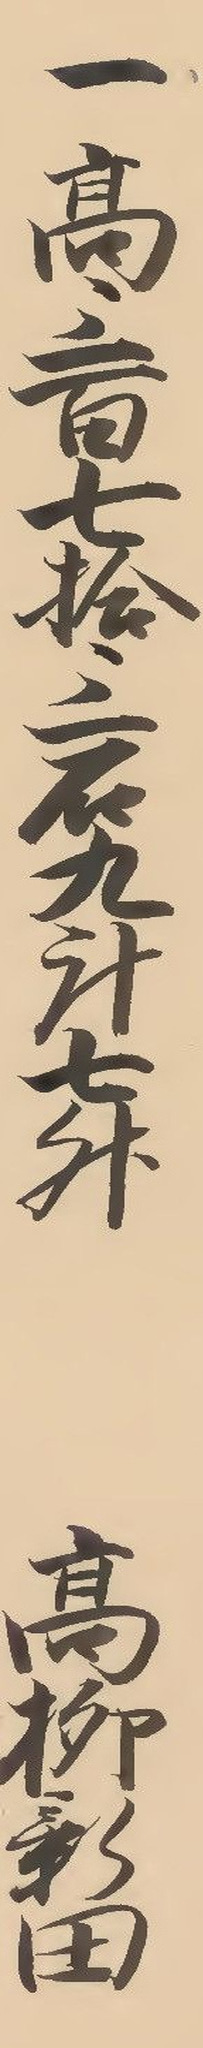一高三百七拾三石九斗七升高柳新田
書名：美濃国郷帳
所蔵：国立公文書館 National Archives of Japan
